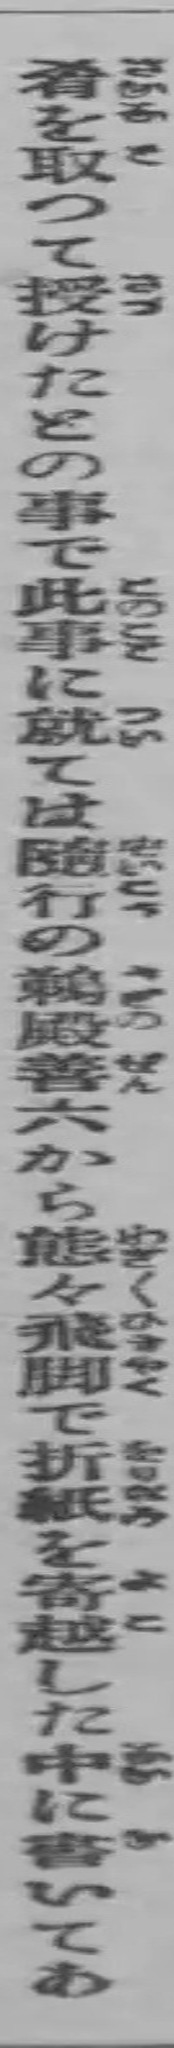肴を取つて授けたとの事で此事に就ては随行の鵜殿善六から態々飛脚で折紙を寄越した中に書いてあ
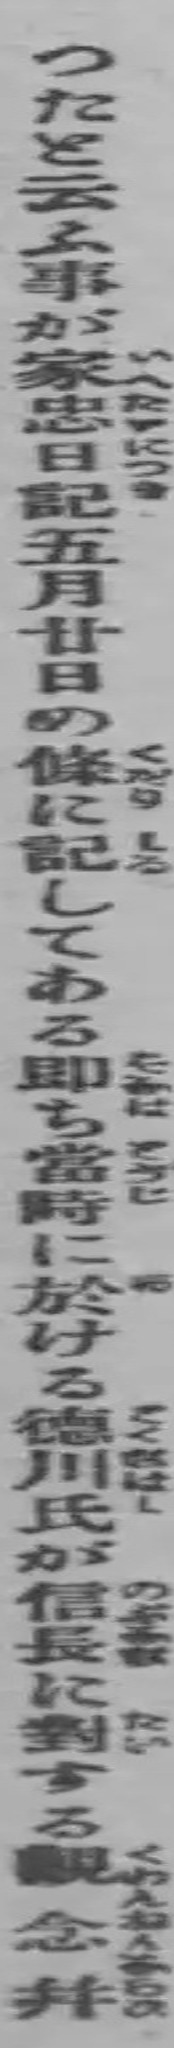つたと云ふ事が家忠日記五月廿日の条に記してある即ち当時に於ける徳川氏が信長に対する観念幷

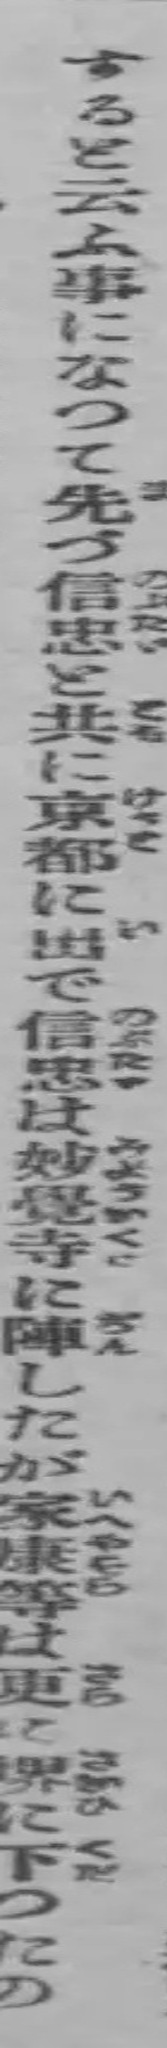信長の西征すると云ふ事になつて先づ信忠と共に京都に出で信忠は妙覚寺に陣したが家康等は更に堺に下つたの
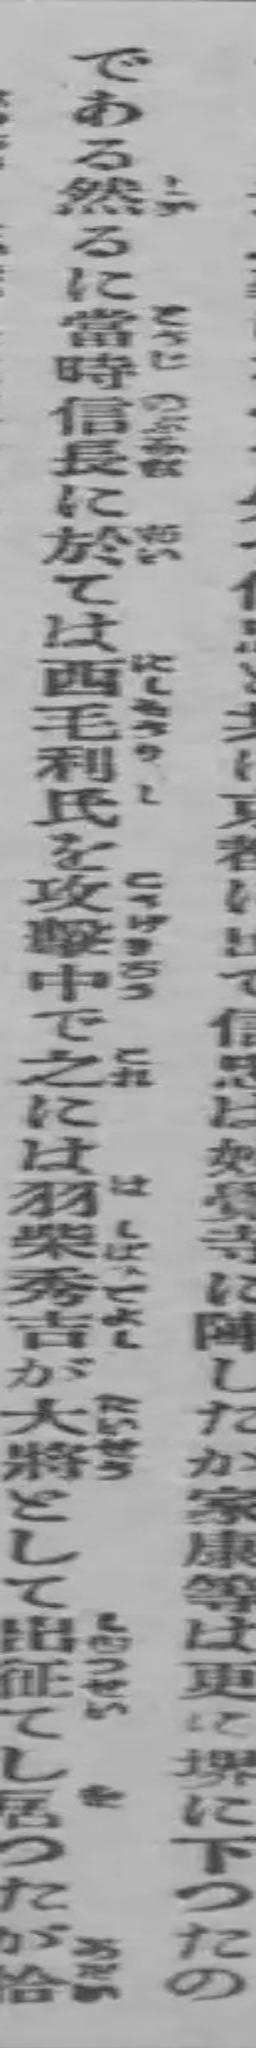である然るに当時信長に於ては西毛利氏を攻撃中で之には羽柴秀吉が大将として出征てし居つたが恰
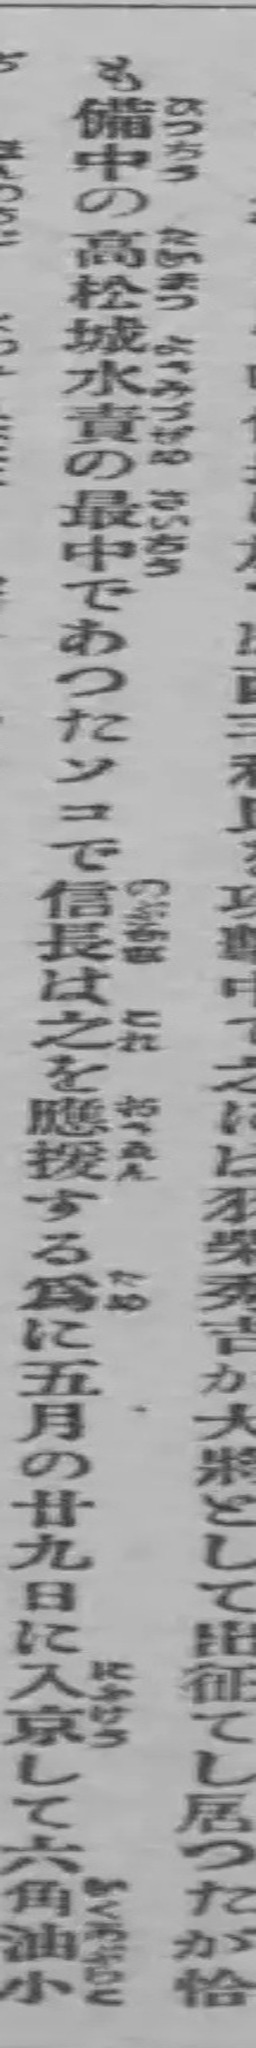も備中の高松城水責の最中であつたソコで信長は之を応援する為に五月の廿九日に入京して六角油小路
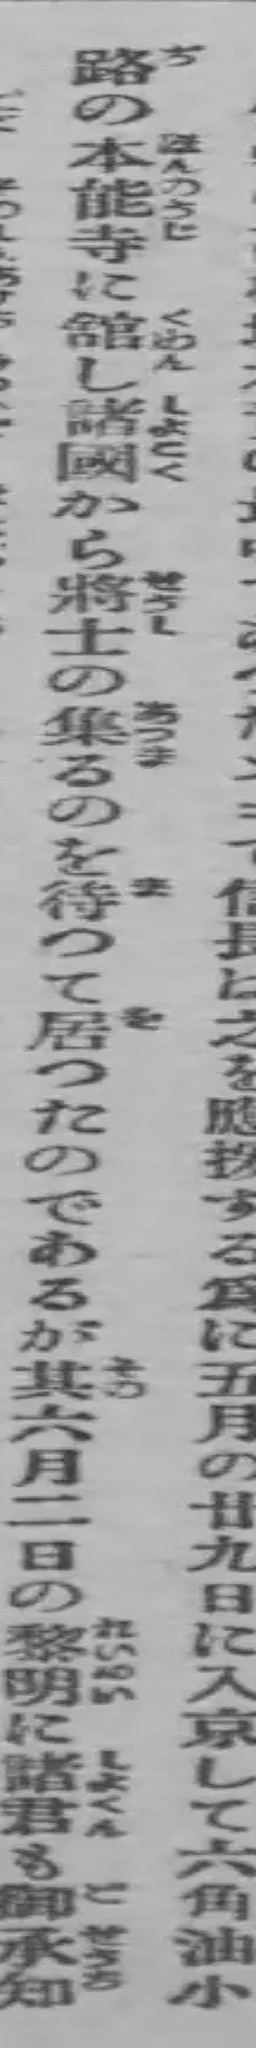本能寺の変路の本能寺に舘し諸国から将士の集るのを待つて居つたのであるが其六月二日の黎明に諸君も御承知
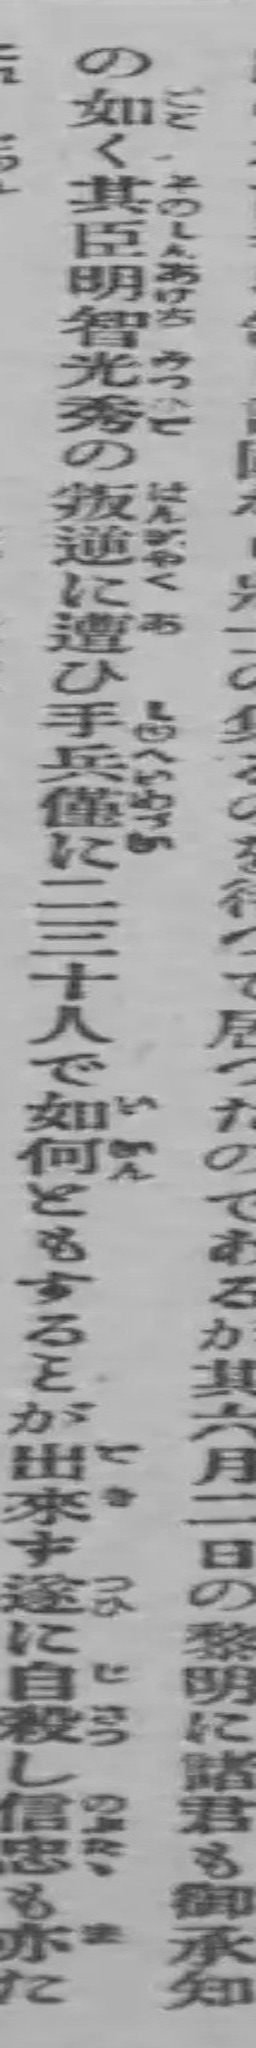の如く其臣明智光秀の叛逆に遭ひ手兵僅に二三十人で如何ともすることが出来ず遂に自殺し信忠も亦た
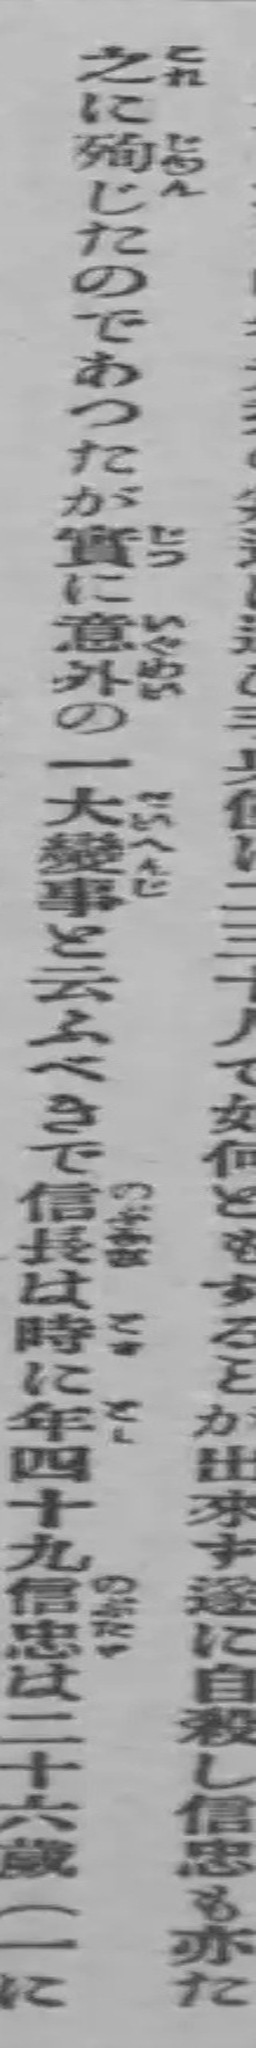之に殉じたのであつたが実に意外の一大変事と云ふべきで信長は時に年四十九信忠は二十六歳(一に
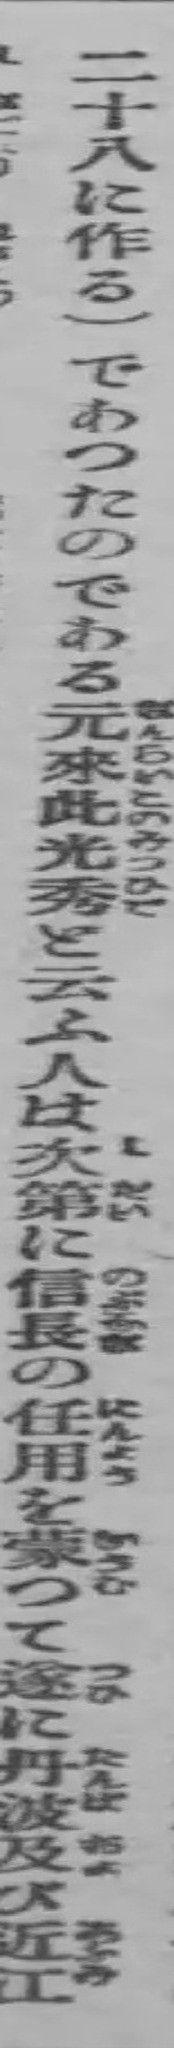二十八に作る)であつたのである元来此光秀と云う人は次第に信長の任用を蒙つて遂に丹波及び近江
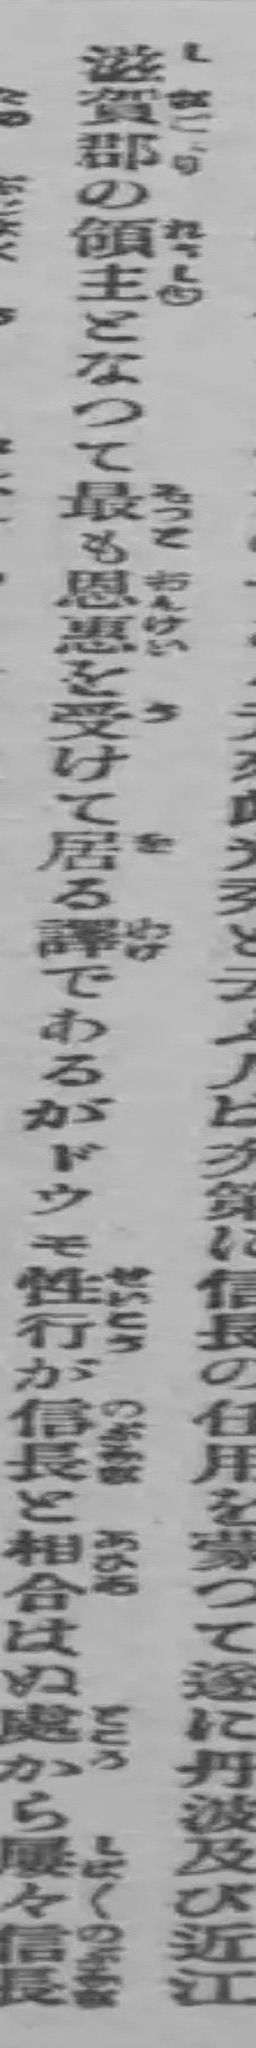滋賀郡の領主となつて最も恩恵を受けて居る訳であるがドウモ性行が信長と相合はぬ処から屡々信長
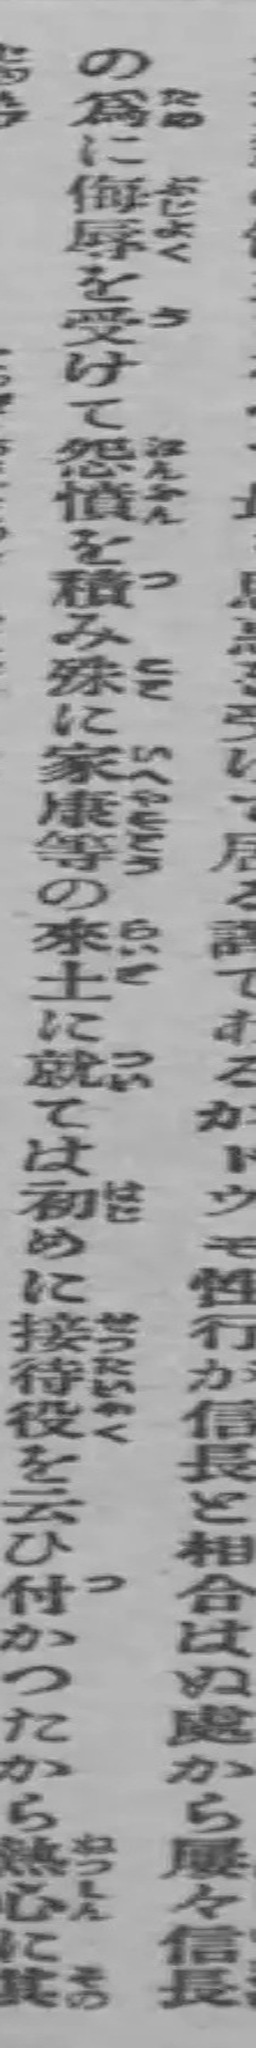の為に侮辱を受けて怨憤を積み殊に家康等の来土に就ては初めに接待役を云ひ付かつたから熱心に其
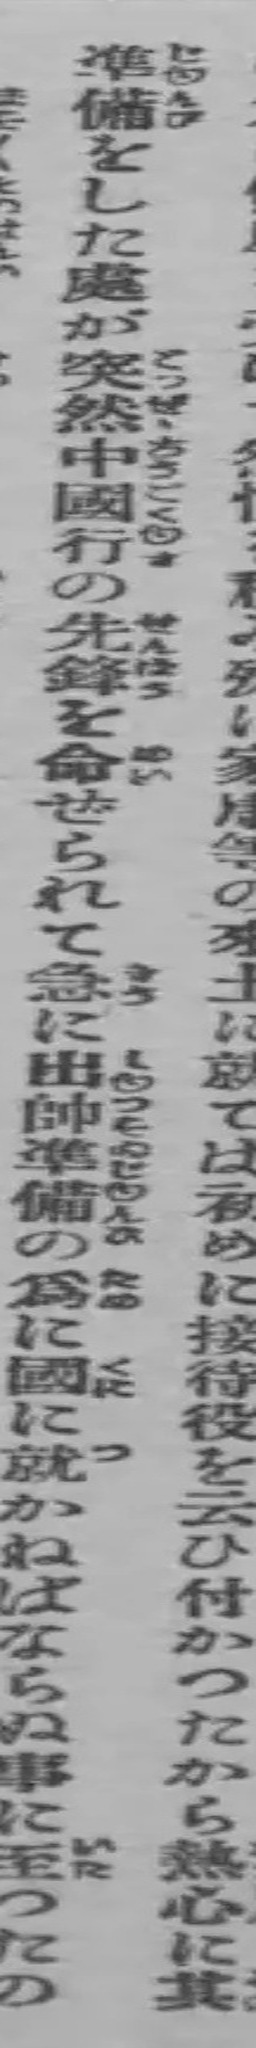準備をした処が突然中国行の先鋒を命ぜられて急に出帥準備の為に国に就かねばならぬ事に至つたの
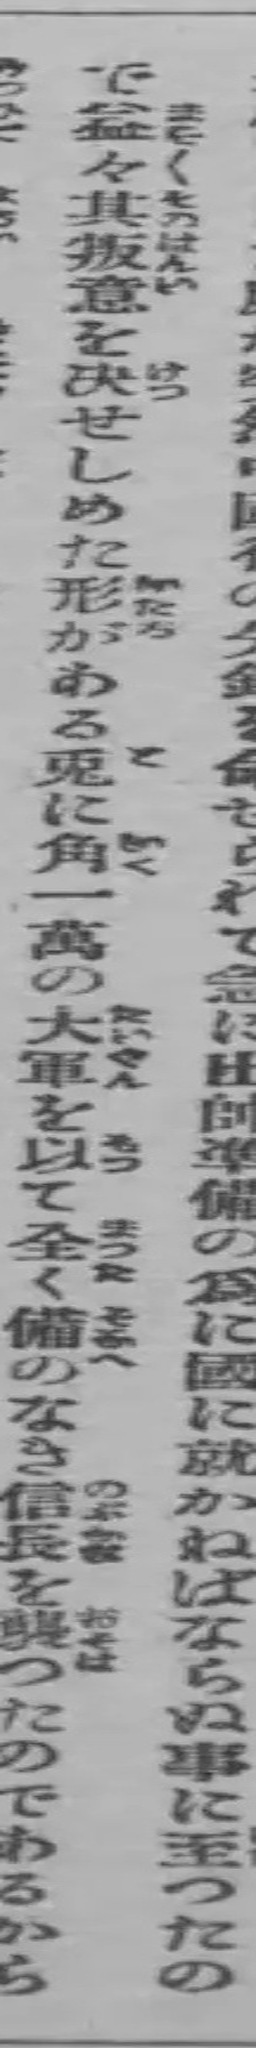で益々其叛意を決せしめた形がある兎に角一万の大軍を以て全く備のなき信長を襲つたのであるから
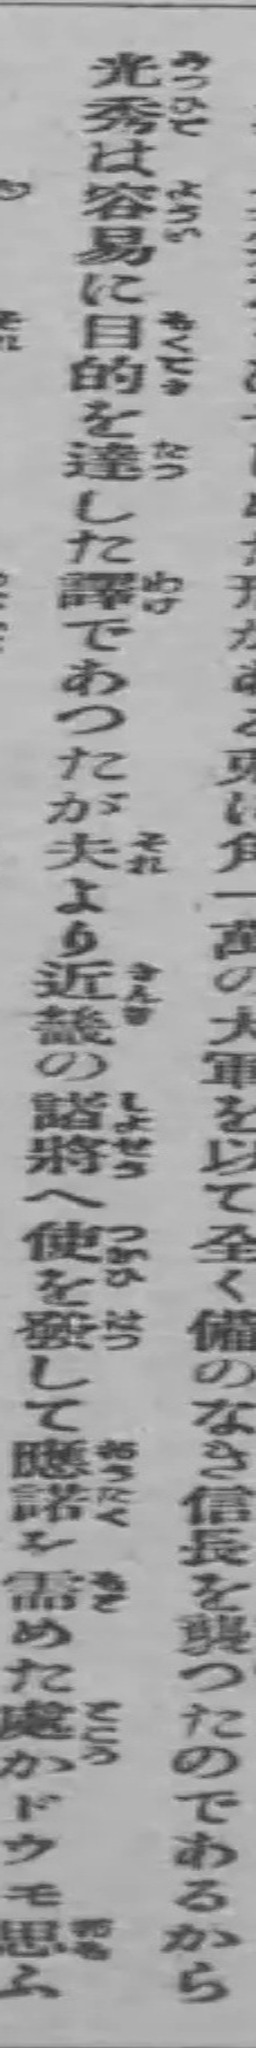光秀は容易に目的を達した訳であつたが夫より近畿の諸将へ使を発して応諾を需めた処かドウモ思ふ
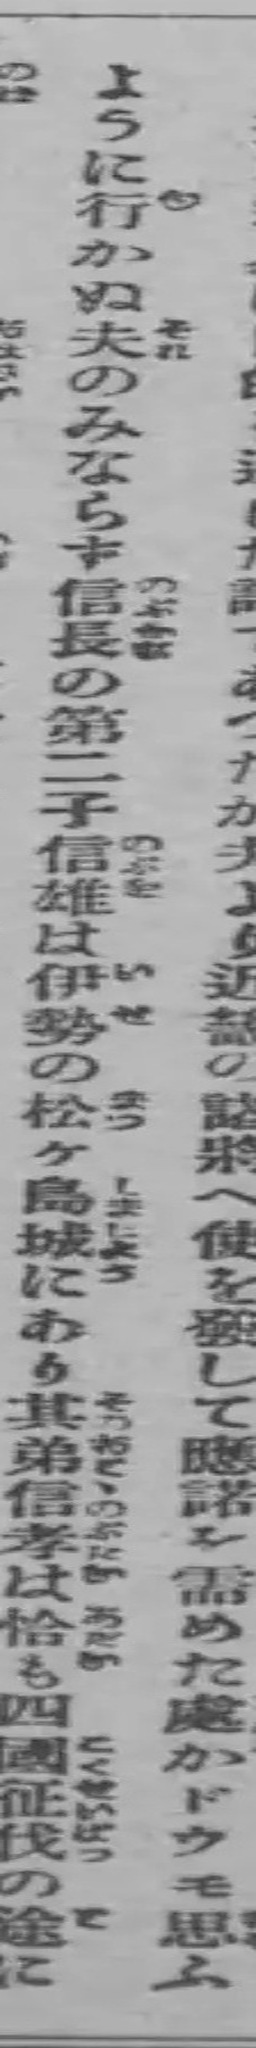ように行かぬ夫のみならず信長の第二子信雄は伊勢の松ヶ島城にあり其弟信孝は恰も四国征伐の途に
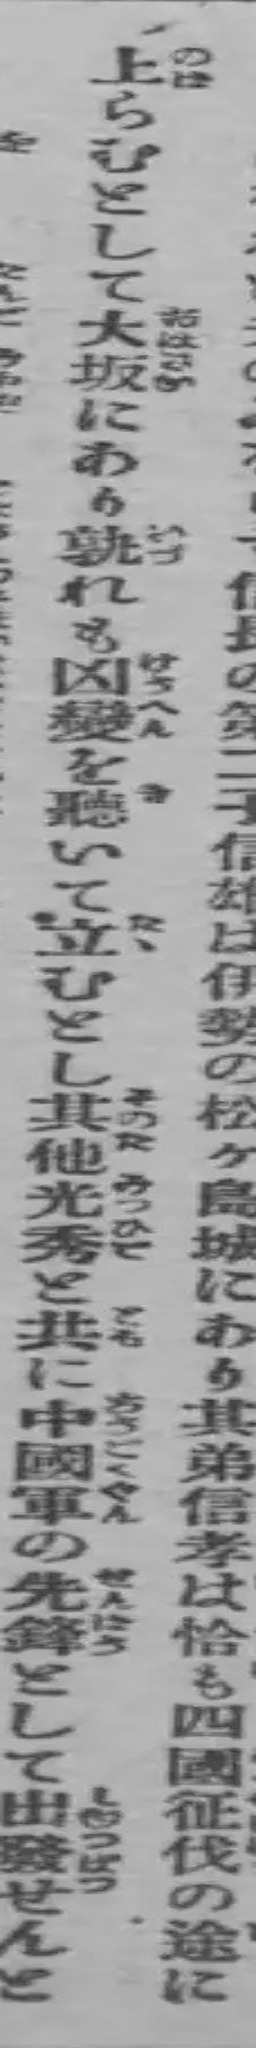上らむとして大坂にあり孰れも凶変を聴いて立むとし其他光秀と共に中国軍の先鋒として出発せんと
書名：豊橋市史談
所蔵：国立国会図書館 National Diet Library, JAPAN
